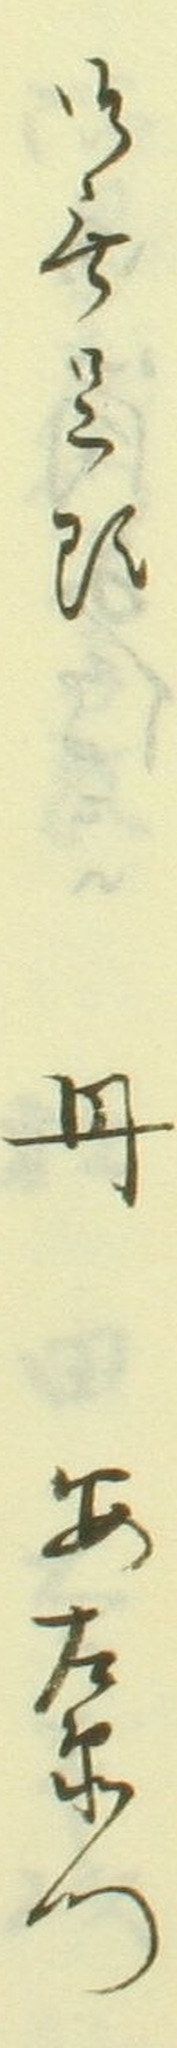御？足頭丹安左衛門
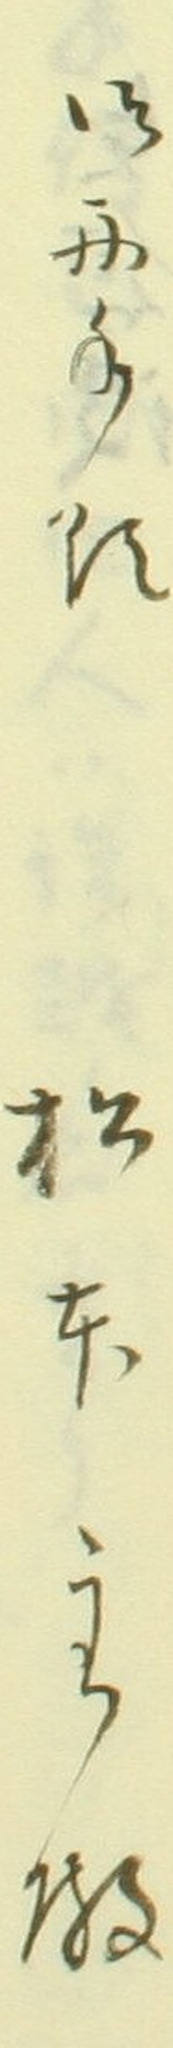御舟水頭松本主殿
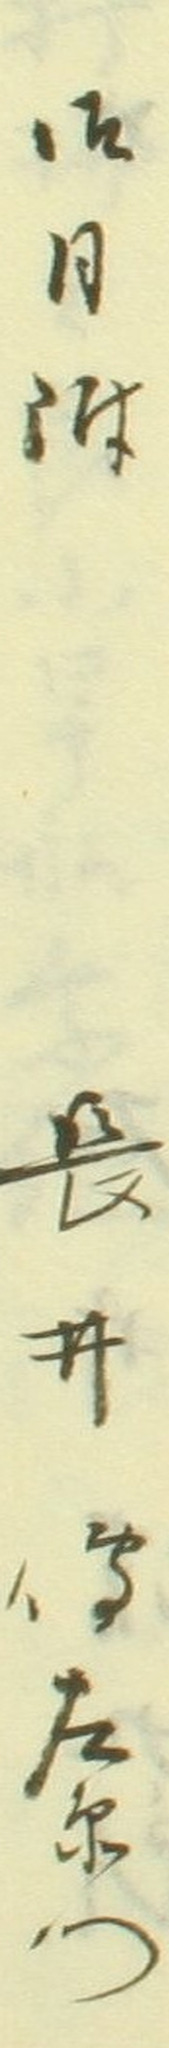御目附長井伝左衛門
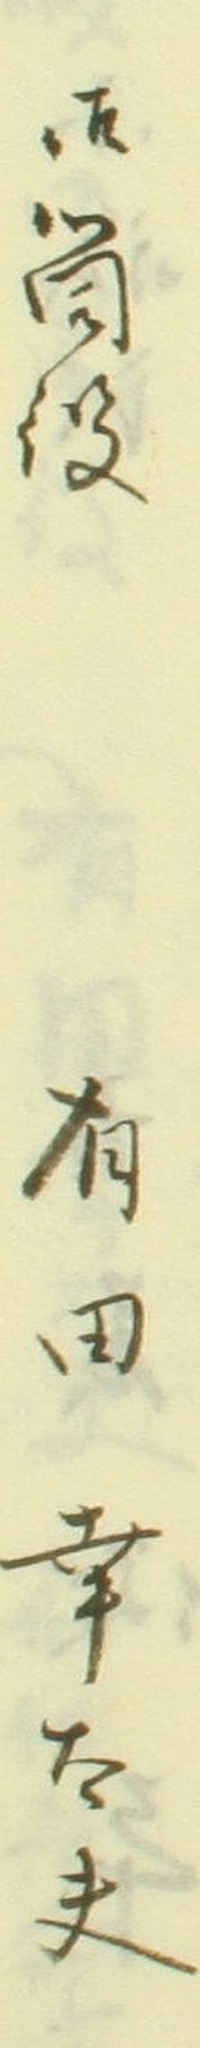御筒役有田幸太夫
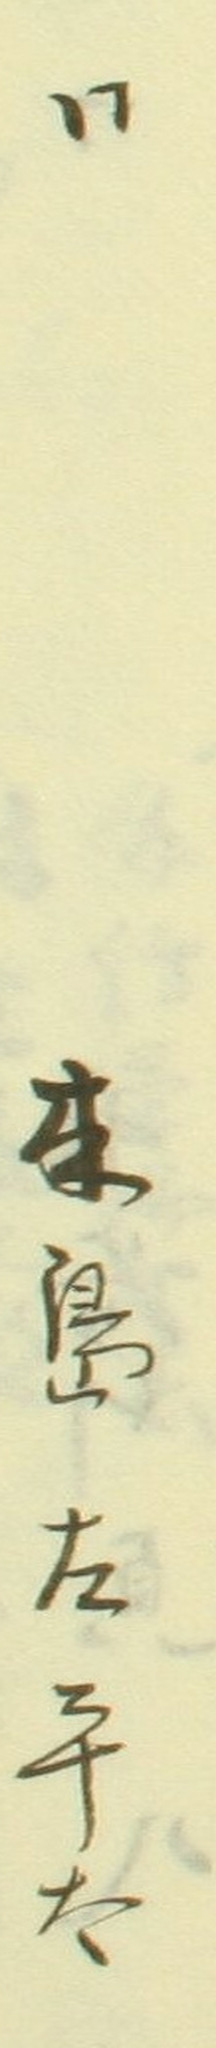同木島左平太
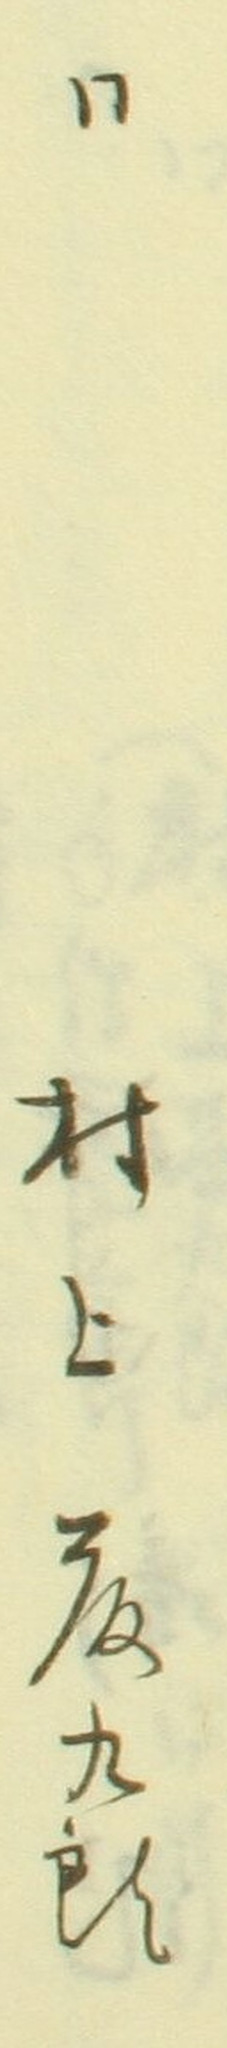同村上籐九郎

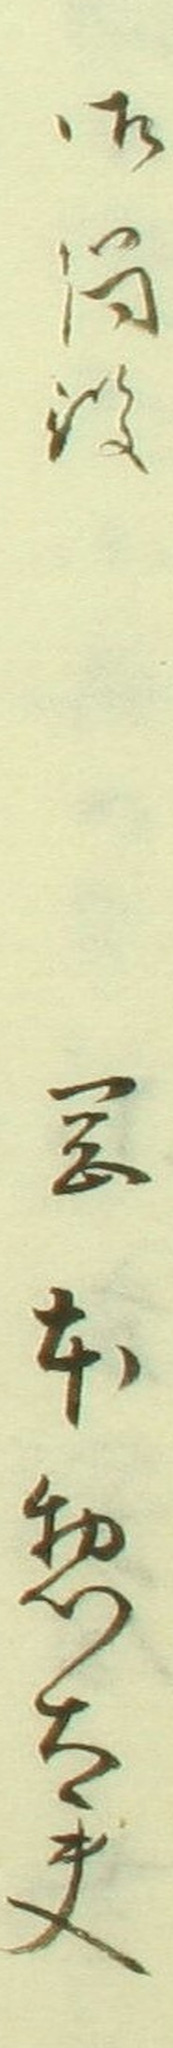御筒役岡本惣太夫
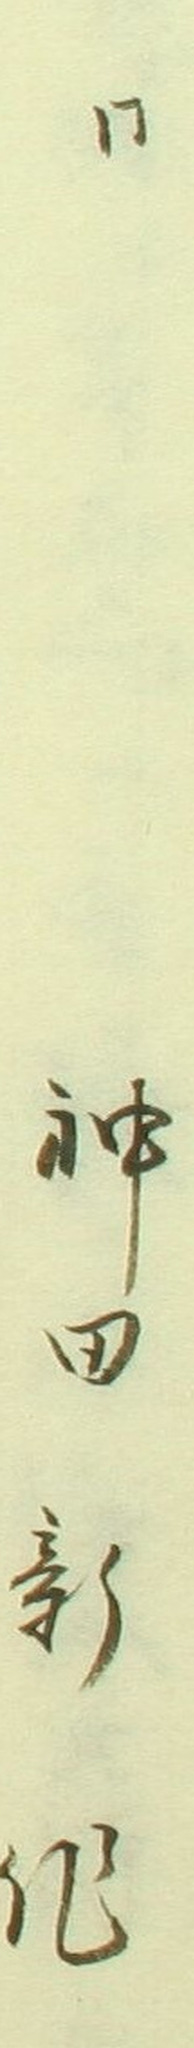同神田新作
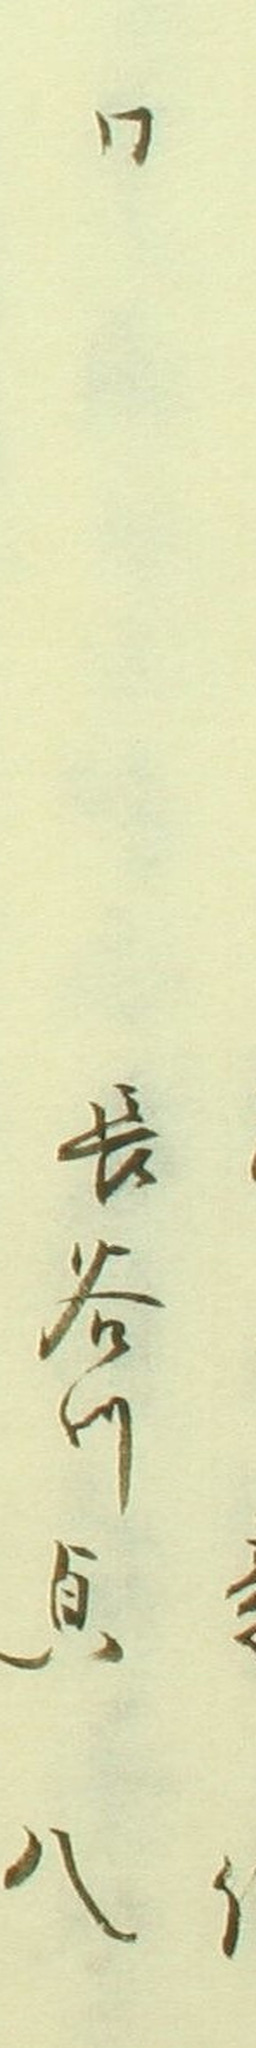同長谷川貞八
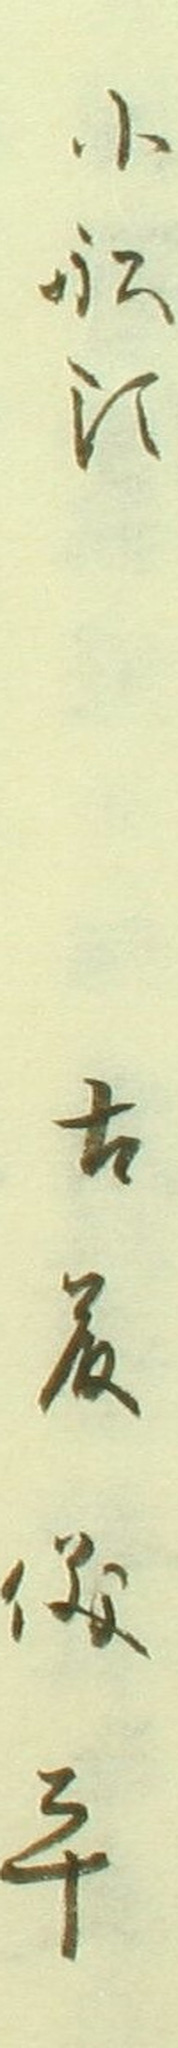小船頭古藤儀平
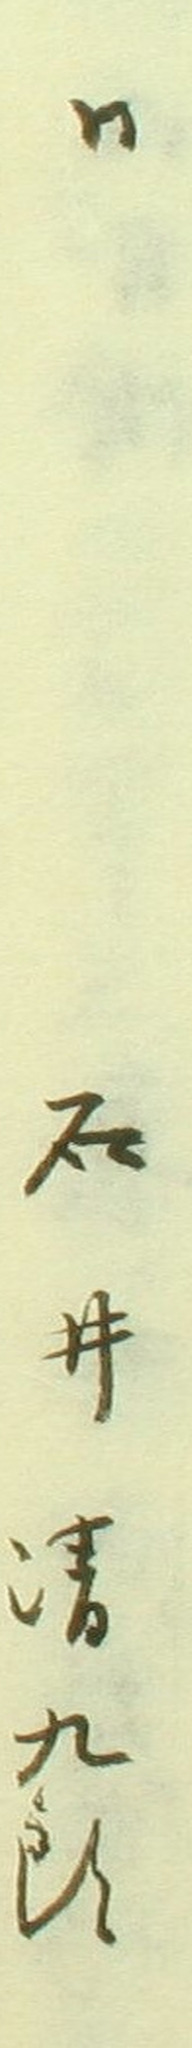同石井清九郎
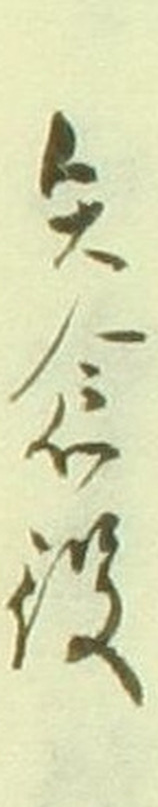矢倉役
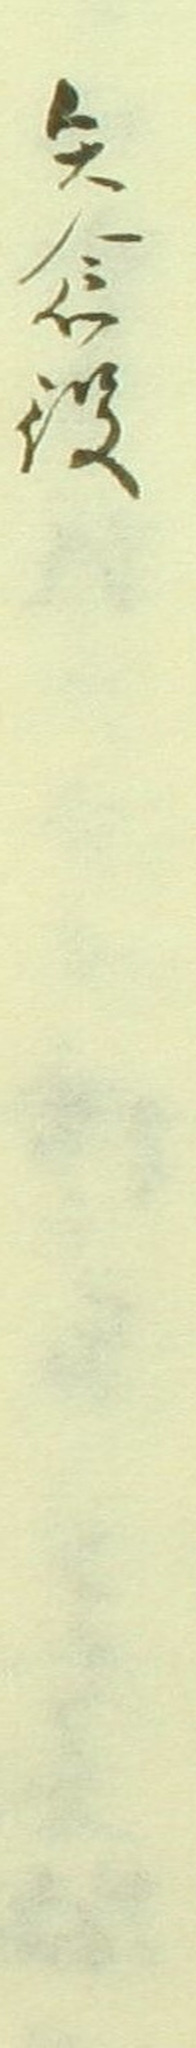矢倉役
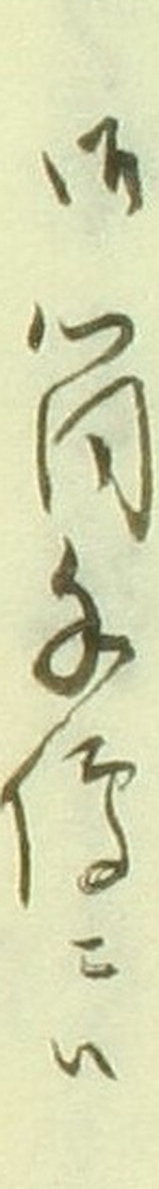御筒手伝に候
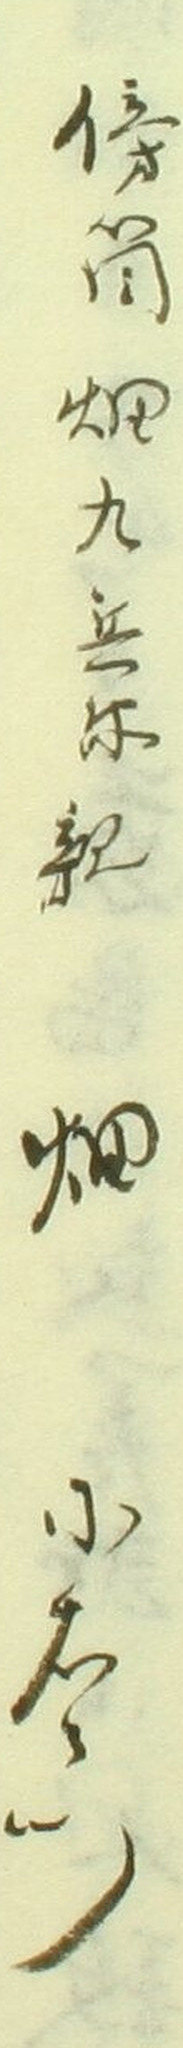傍筒畑九兵衛親畑小右衛門
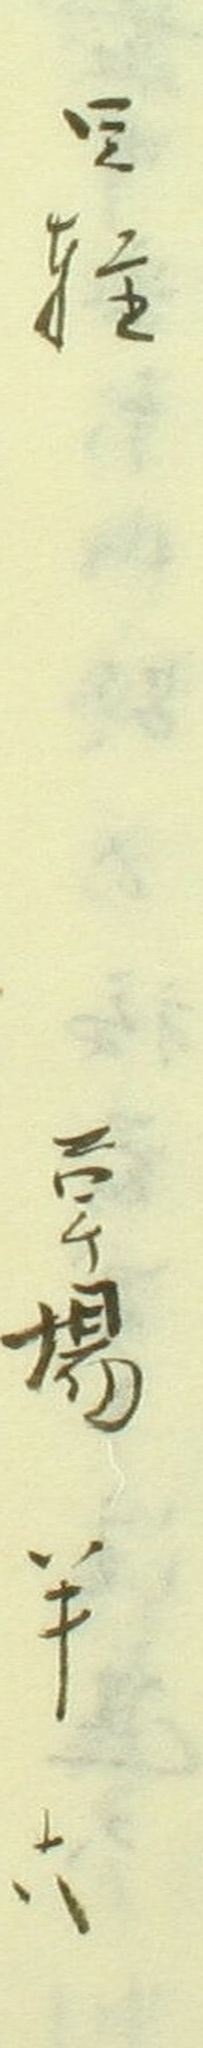足軽呑け場半六
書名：唐船漂流記 三
